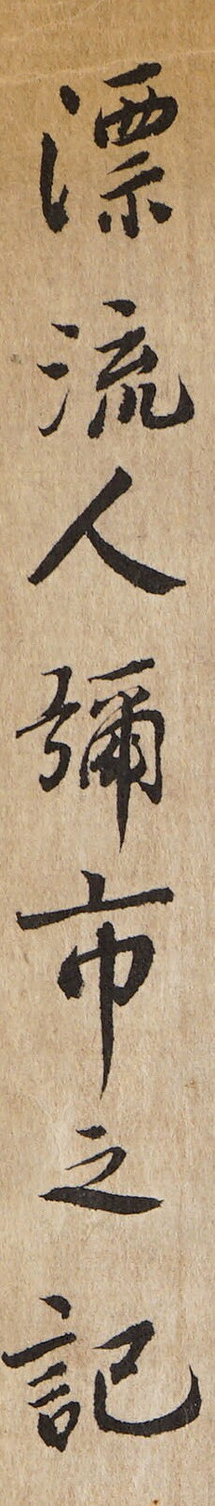漂流人彌市之記

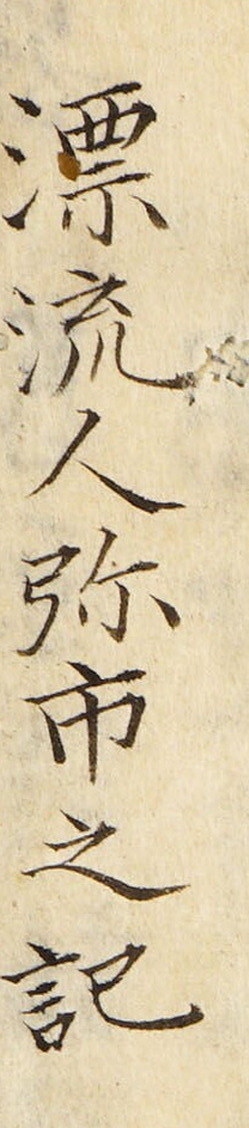漂流人弥市之記

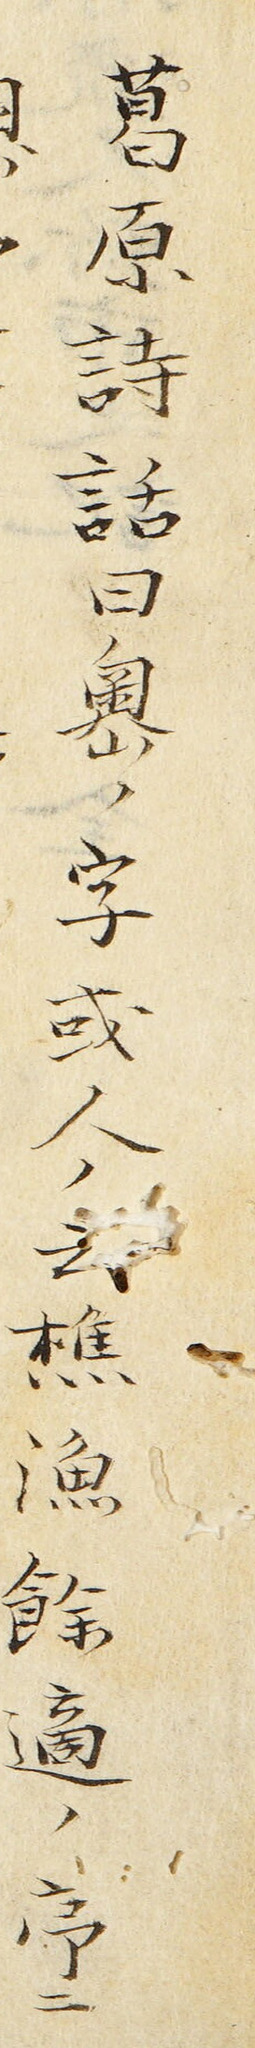嶴葛原詩話曰嶴ノ字或人ノ云樵漁余適ノ序ニ
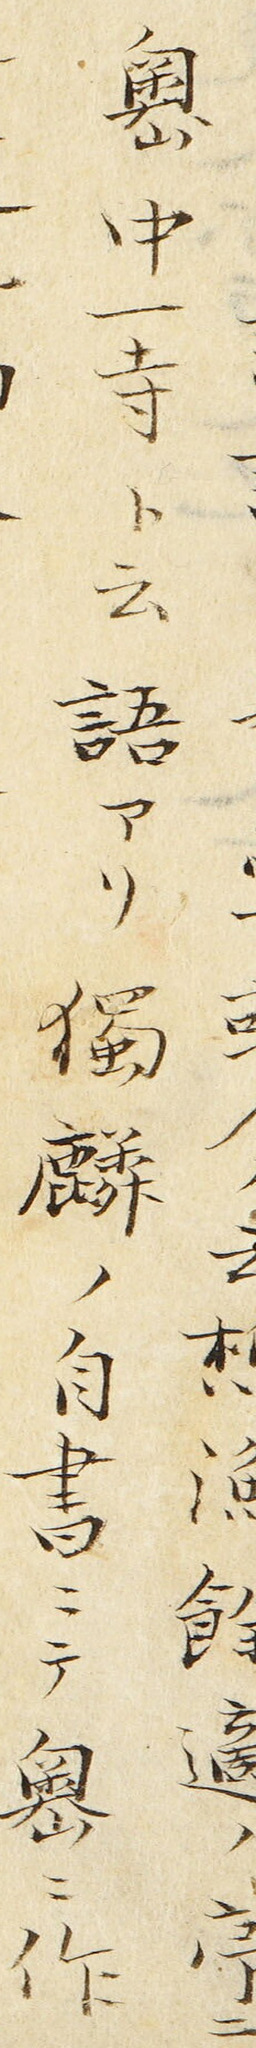嶴中一寺ト云語アリ獨麟ノ自書ニテ嶴ニ作
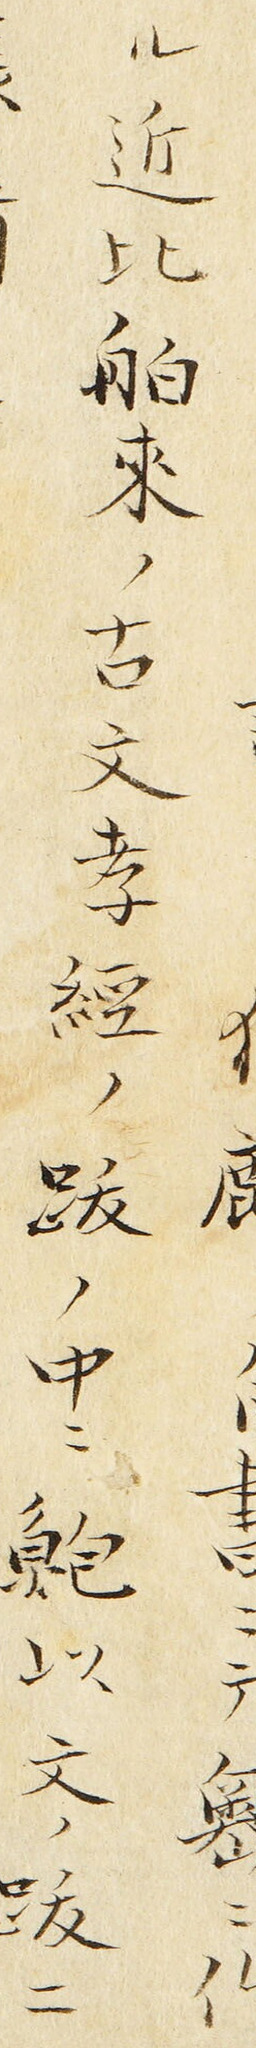ル近比舶来ノ古文孝経ノ跋ノ中ニ鮑以文ノ跋ニ
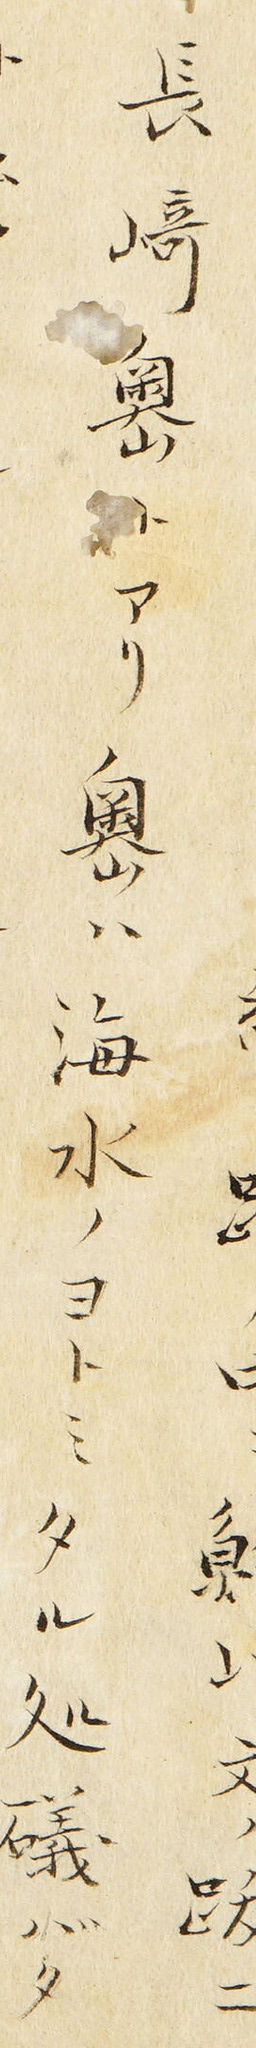長崎嶴トアリ嶴ハ海水ノヨトミタル処礒バタ
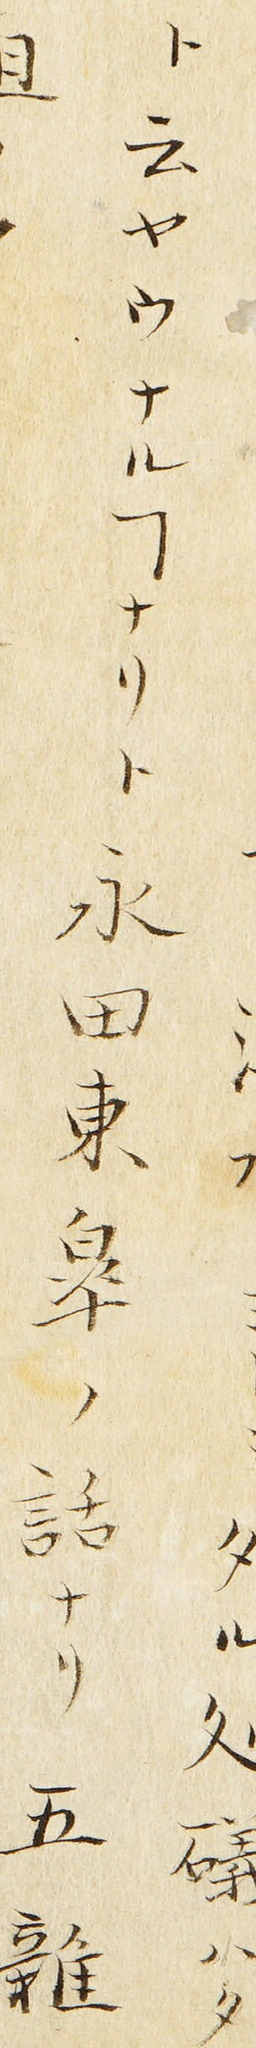ト云ヤウナルコトナリト永田東皋ノ話ナリ五雑
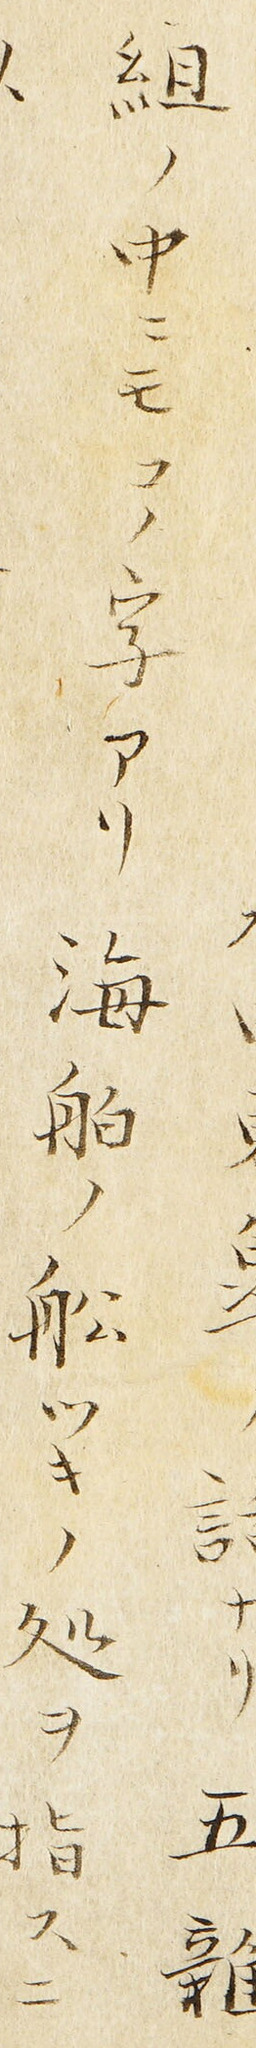組ノ中ニモコノ字アリ海舶ノ船ツキノ処ヲ指スニ
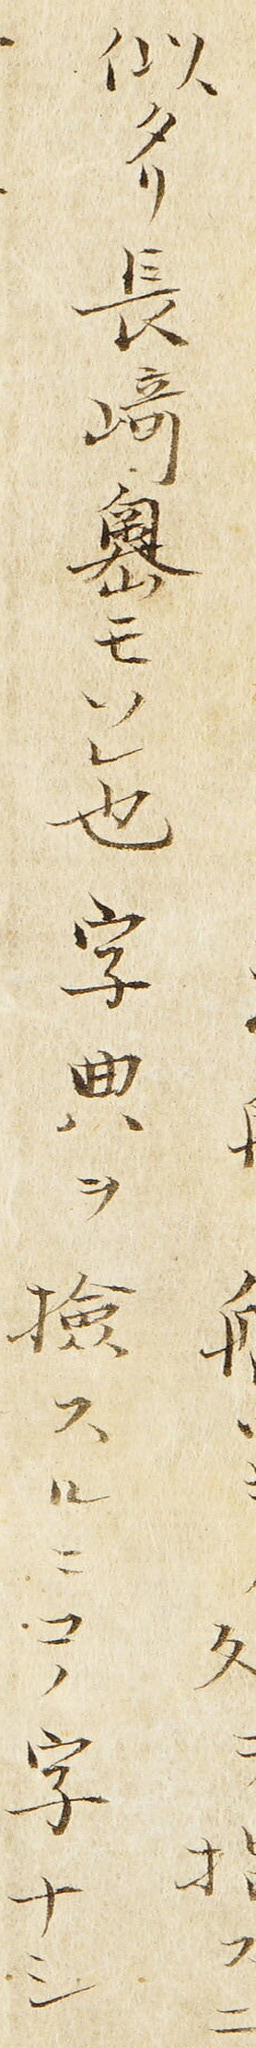似タリ長崎嶴モソレ也字典ヲ撿スルニコノ字ナシ
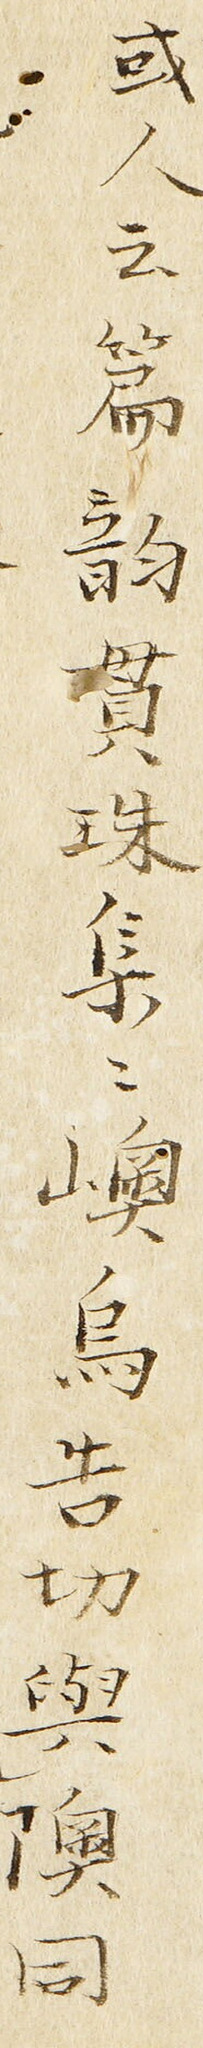或人云篇韵貫珠集ニ㠗烏告切與隩同
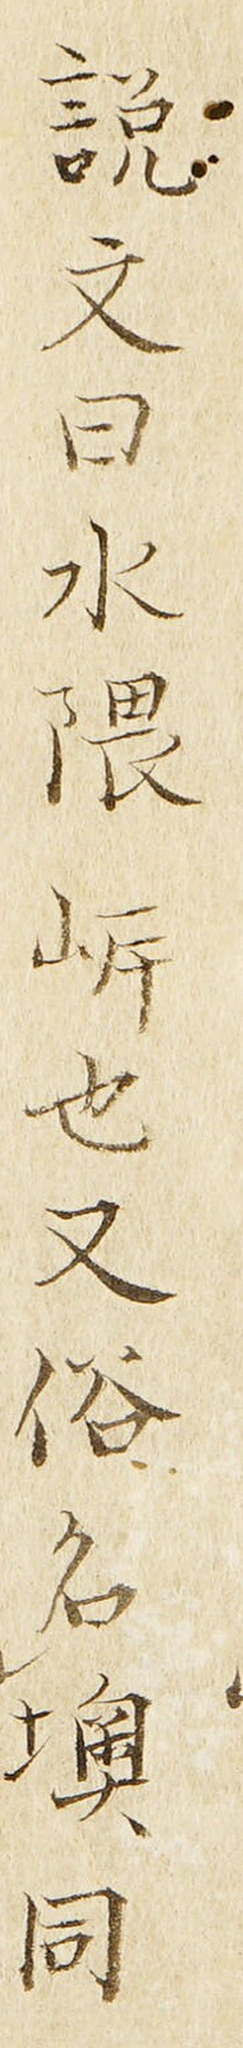説文曰水隈㟁也又俗名墺同
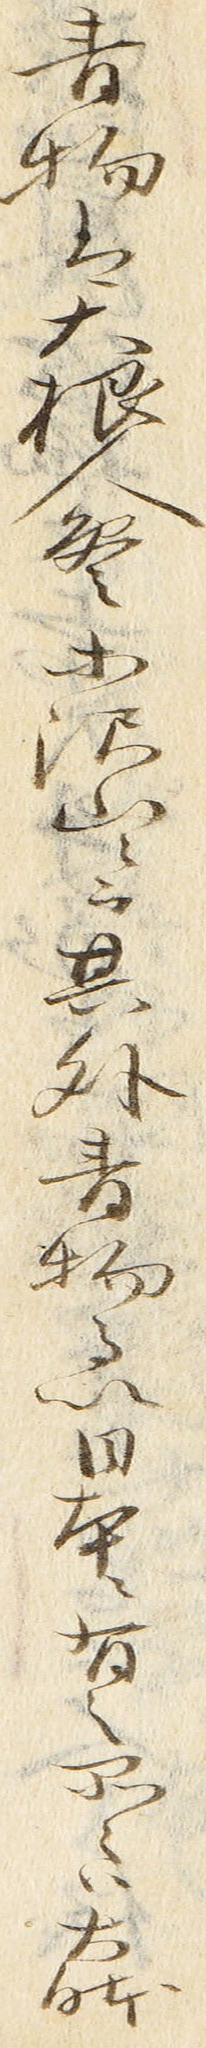青物は大根人参等沢山に而其外青物るい日本に有之品々は大躰
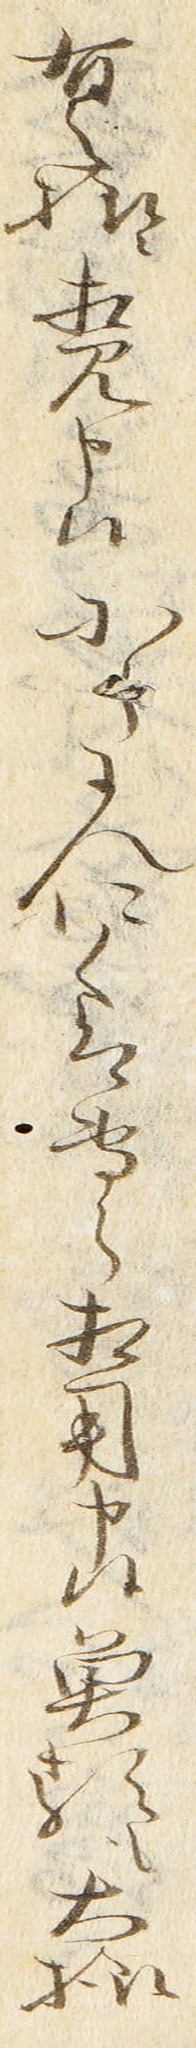有之様に相見申候小にんにくは専ら相用申候魚類も大様
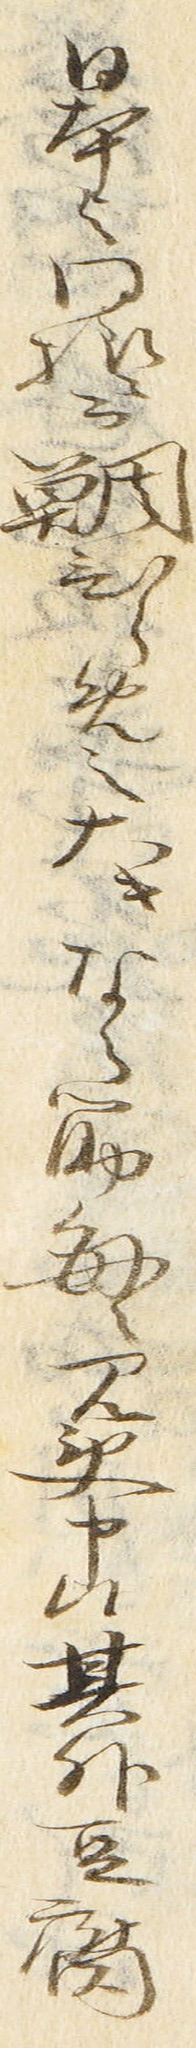日本と同様に鯛ひらめ之大きなる筋毎々見受申候其外豆腐
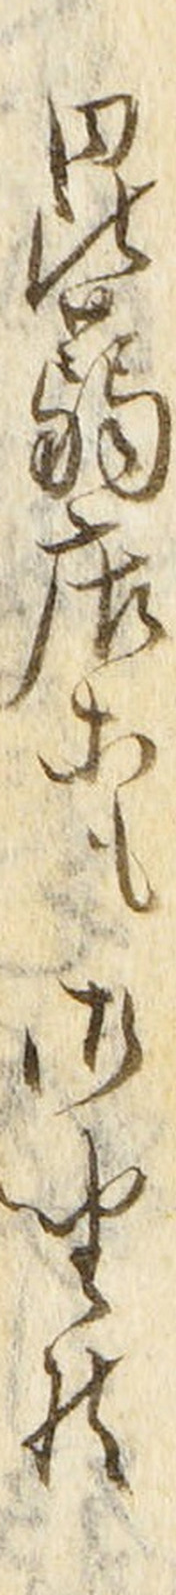昆蒻店等も御座候
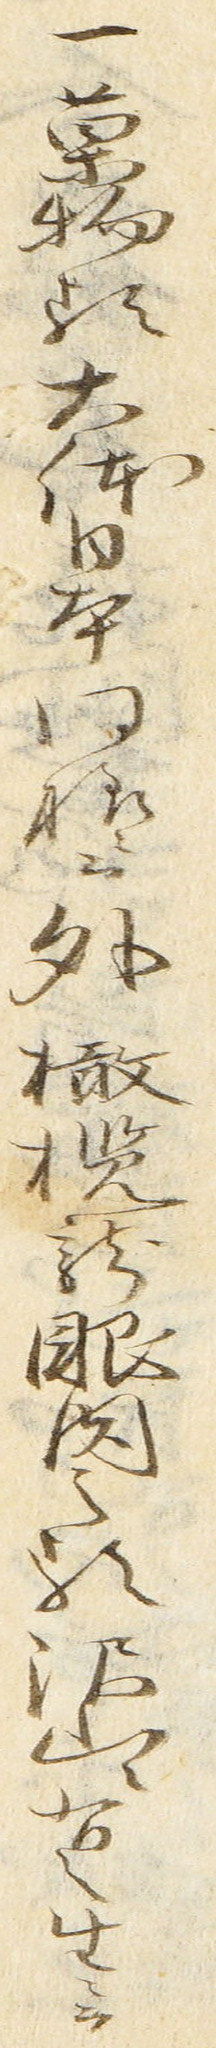一菓物類大体日本同様に而外橄欖龍眼肉之類沢山に有之生に而
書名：漂流人弥市之記
